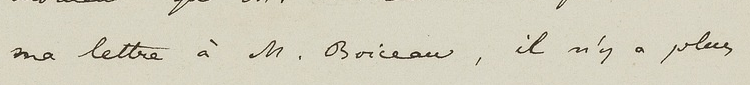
ma lettre à M. Boiceau, il n'y a plus
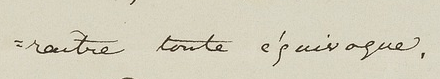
raître toute équivoque.
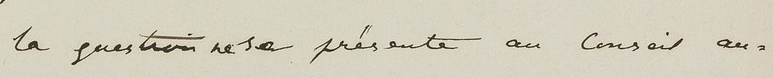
la question ne se présente au Conseil au-
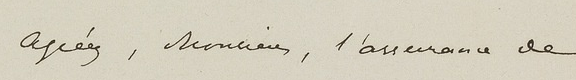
Agréez, Monsieur, l'assurance de
